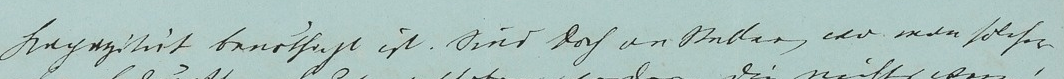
Kapazität benöthigt ist. Sind doch an Stellen, wo man solcher
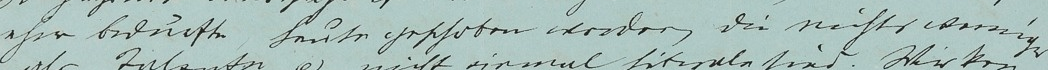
eher bedürfte, Leute geschoben werden, die nichts weniger
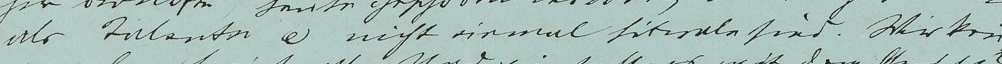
als Talente & nicht einmal Liberale sind. Wir ken-
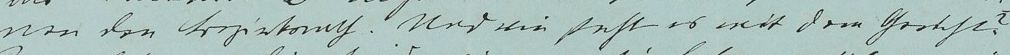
nen den Bezirksrath. Und wie steht es mit dem Gericht?
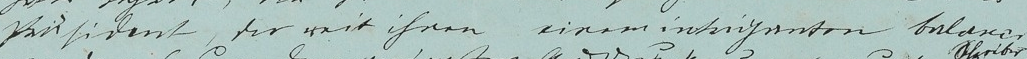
Präsident, der mit ihnen einem intriganten balanci-
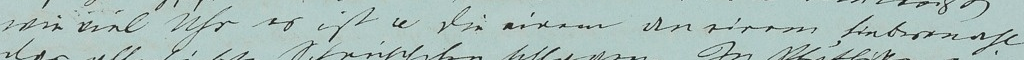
wie viel Uhr es ist & die einem an einem Liebesmahl
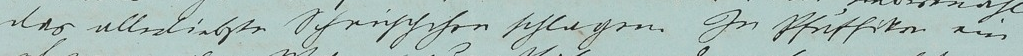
das allerliebste Schnippchen schlagen. In Pfäffikon ein
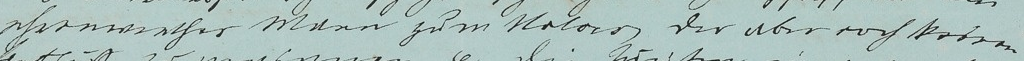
ehrenwerther Mann zum Notar, der aber noch keinen
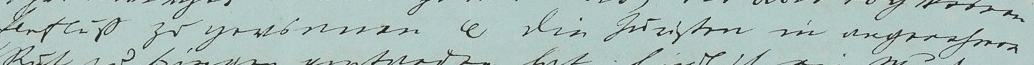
Einfluß zu gewinnen & die Juristen in angenehmen
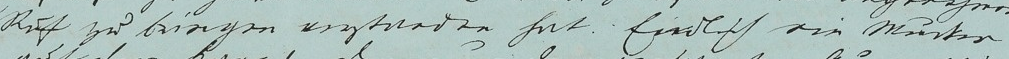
Ruf zu bringen verstanden hat. Endlich ein Mucker
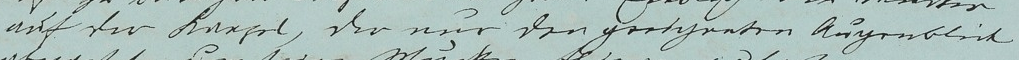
auf der Kanzel, der nur den geeigneten Augenblick
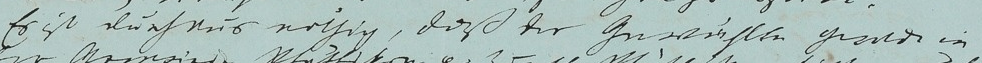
Es ist durchaus nöthig, daß der Gewählte gerade in
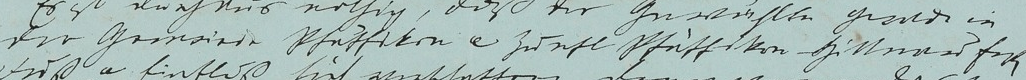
der Gemeinde Pfäffikon & Zunft Pfäffikon–Hittnau fest
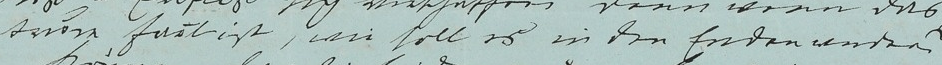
trum faul ist, wie soll es in den Enden werden?
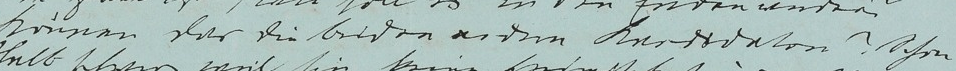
Können das die beiden andern Kandidaten? Schon
